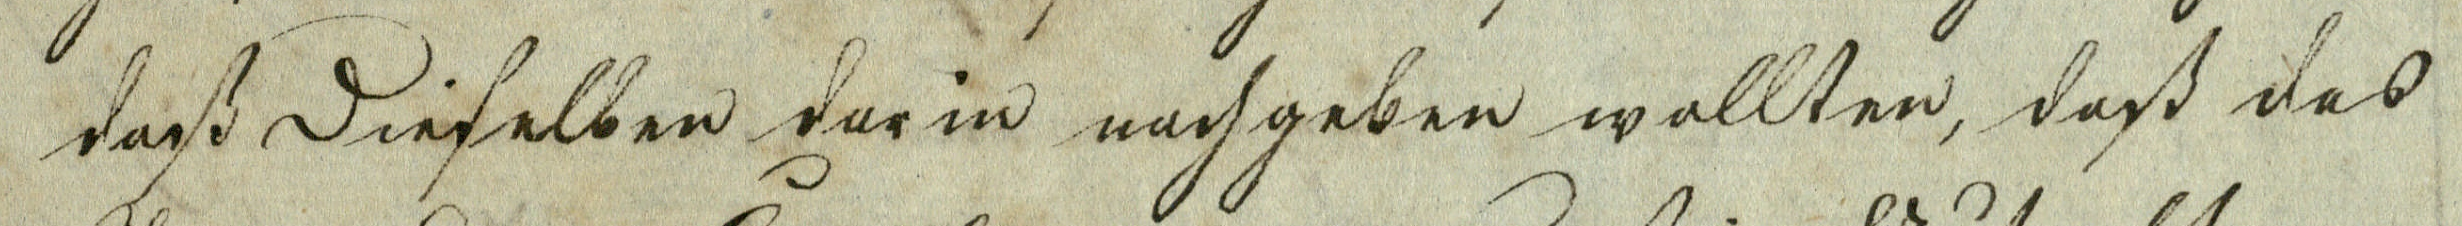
daß dieselben darin nachgeben wollten, daß das
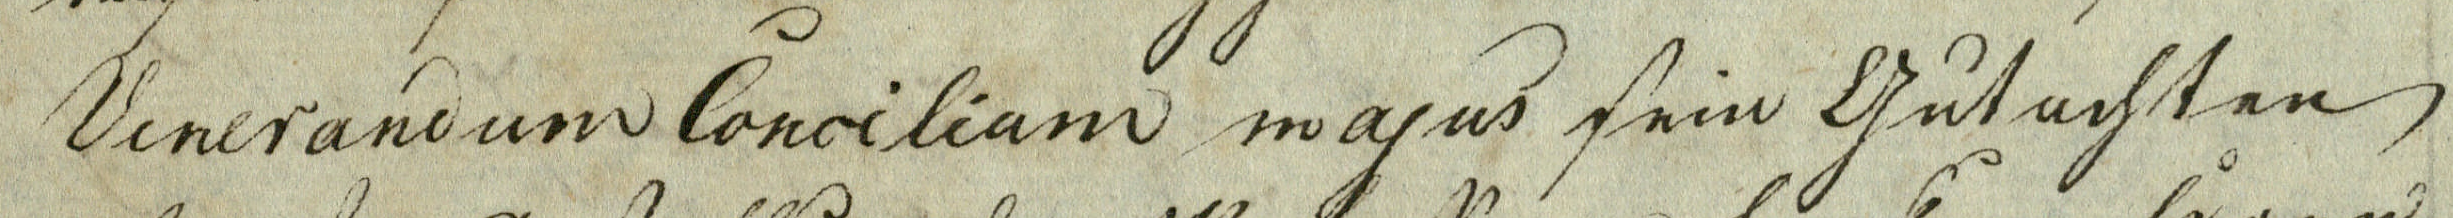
Venerandum Concilium majus seine Gutachten
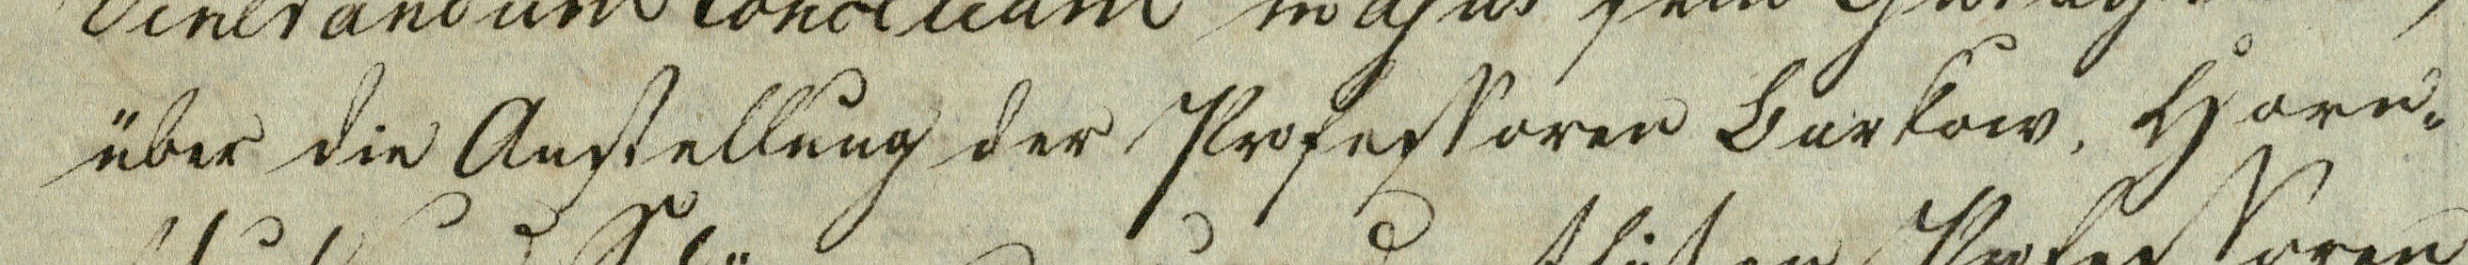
über die Anstellung der Professoren Barkow, Horn¬
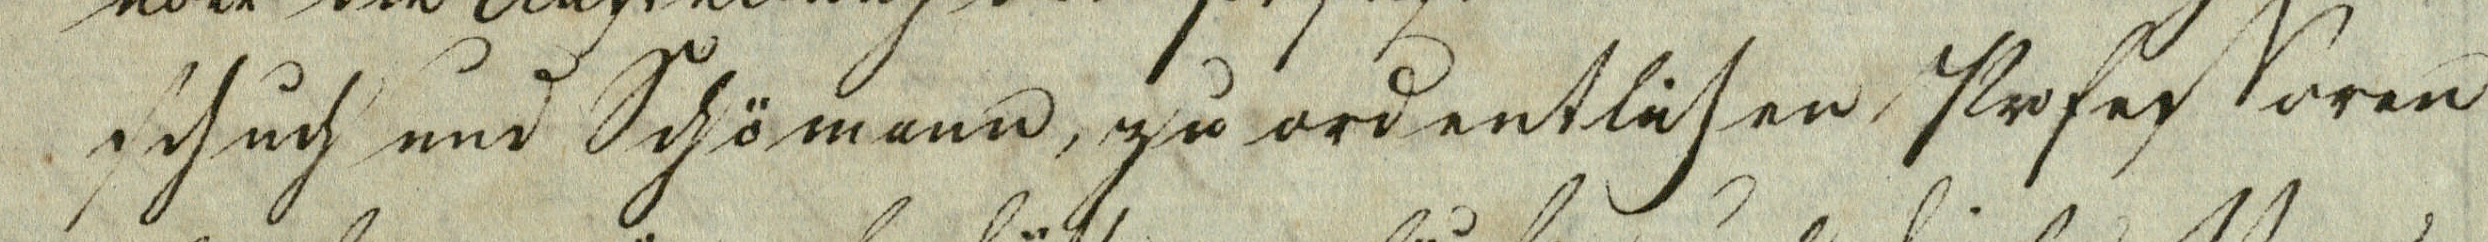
schuch und Schömann, zu ordentlichen Professoren
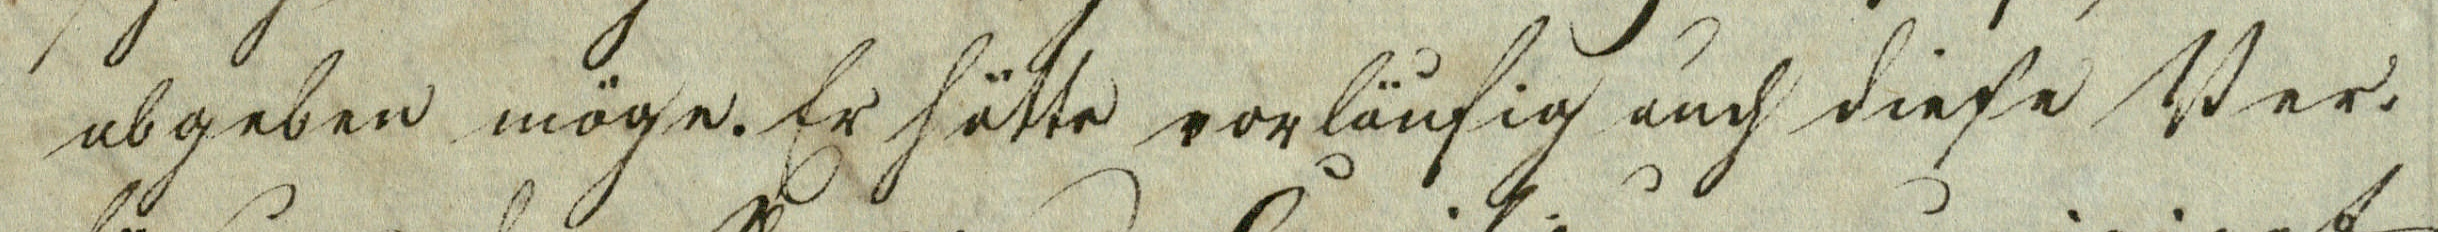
abgeben möge. Er hätte vorläufig auch diese Ver¬
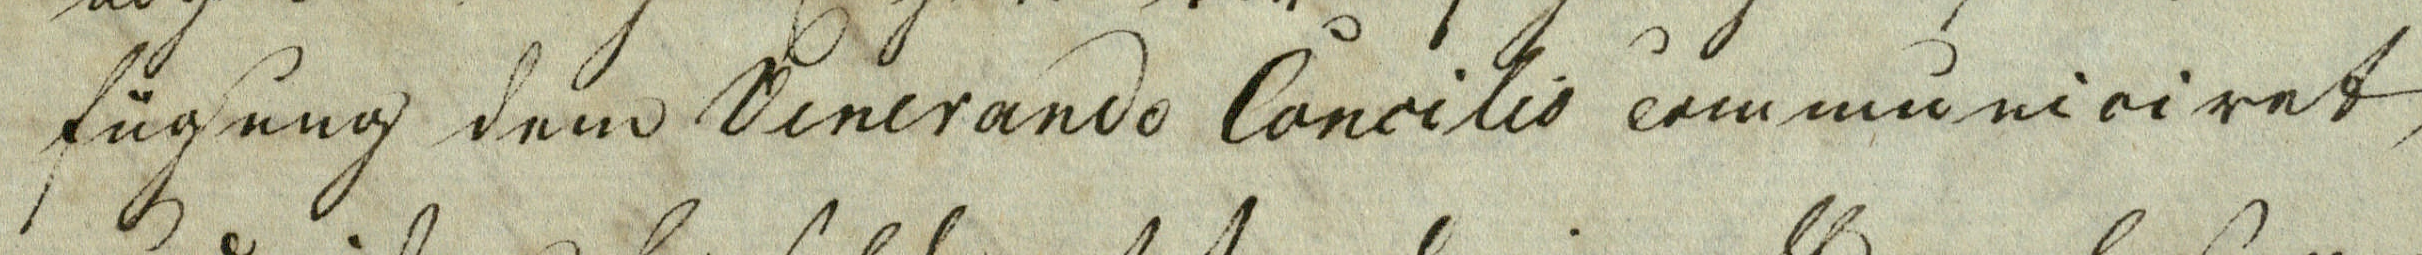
fügung dem Venerando Concilio communiciret,
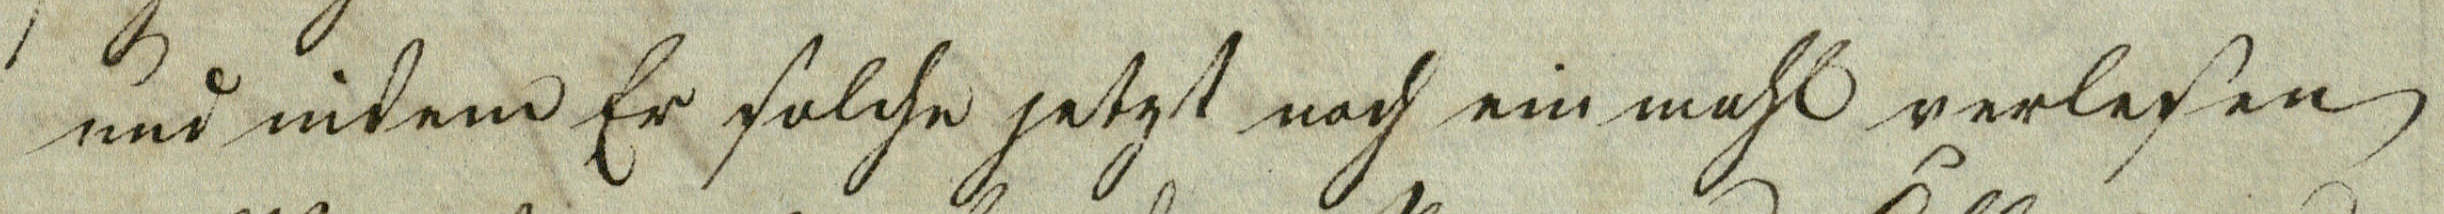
und indem Er solche jetzt noch einmahl verlesen
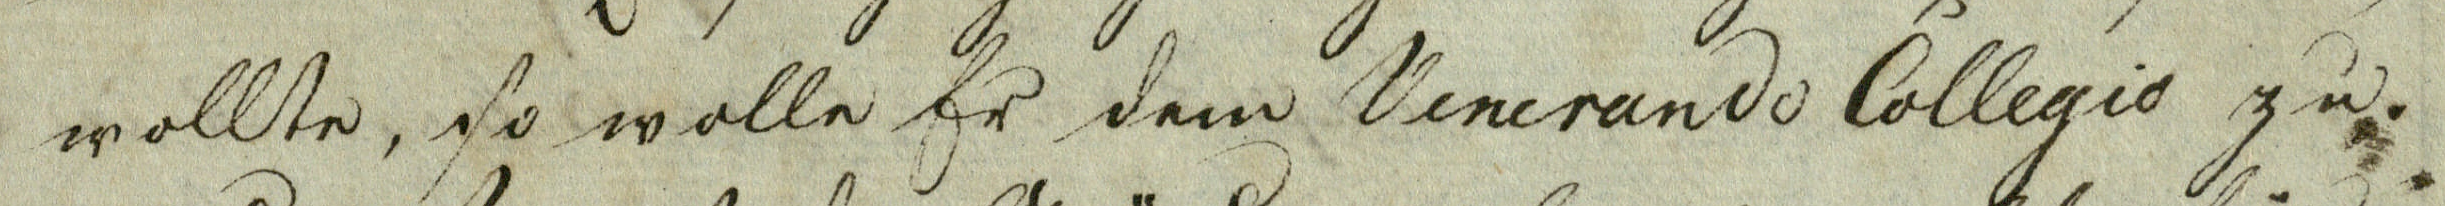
wollte, so wolle Er dem Venerando Collegio zu¬
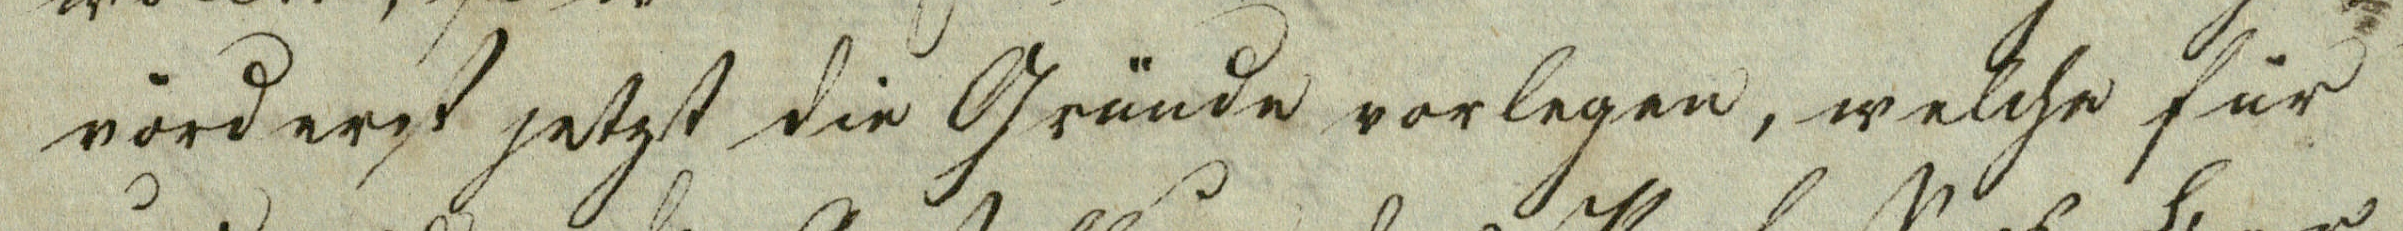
vörderst jetzt die Gründe vorlegen, welche für
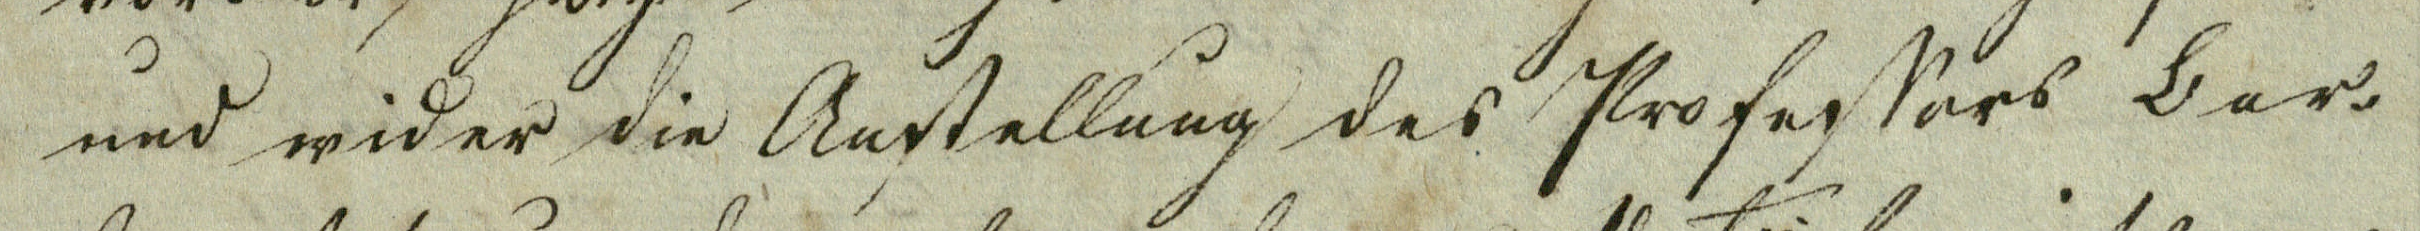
und wider die Anstellung des Professors Bar¬
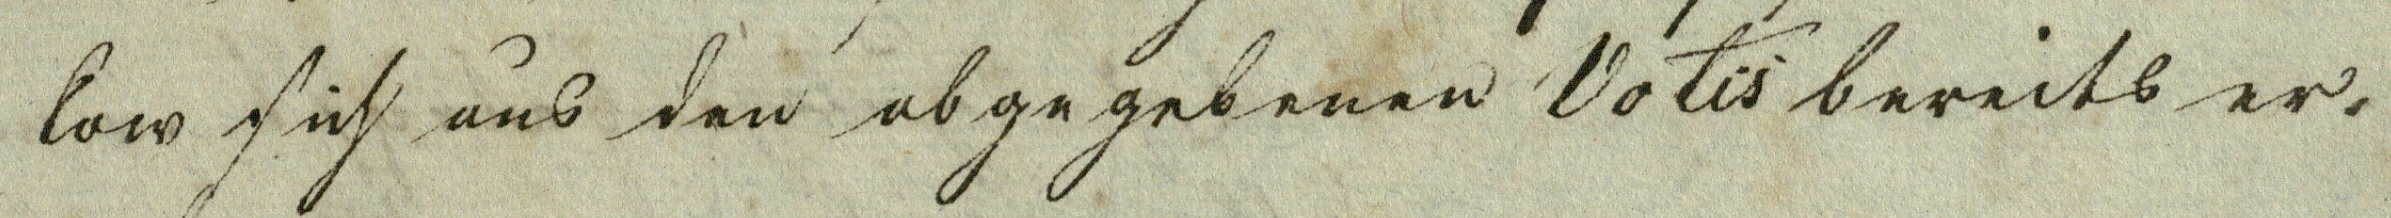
kow sich aus den abgegebenen Votis bereits er¬
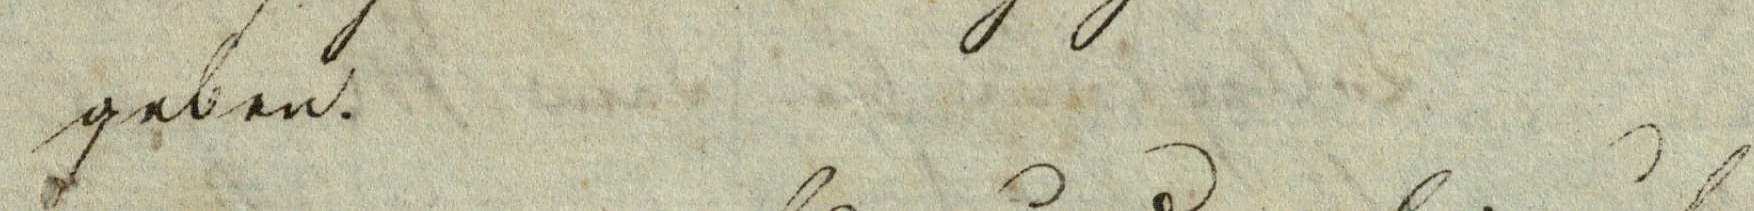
geben.
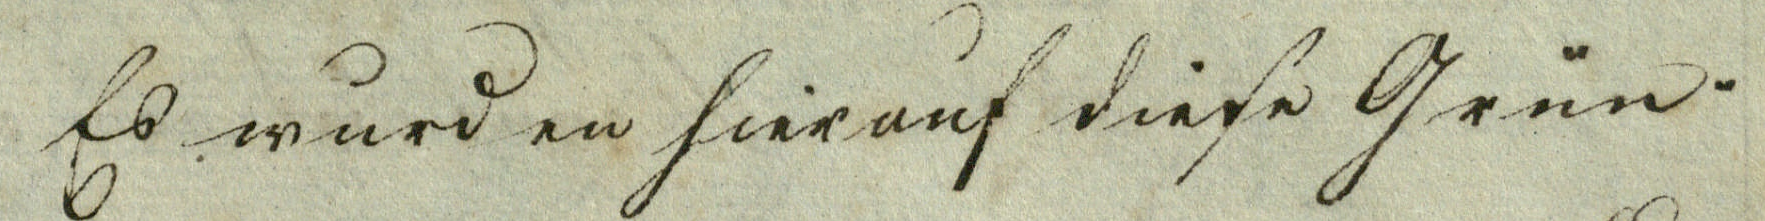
Es wurden hierauf diese Grün¬
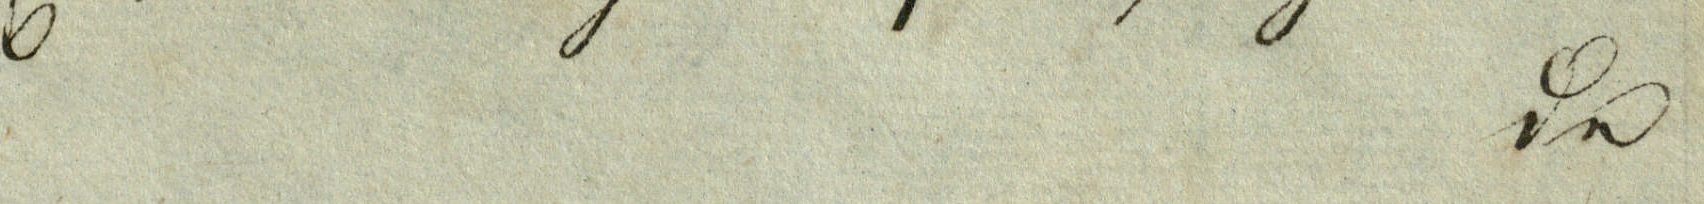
de.
